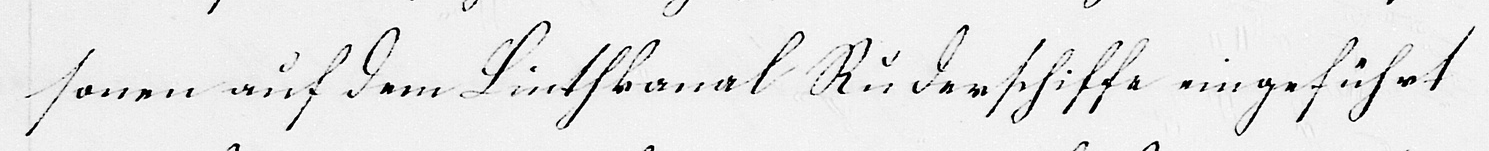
sonen auf dem Linthkanal Ruderschiffe eingeführt
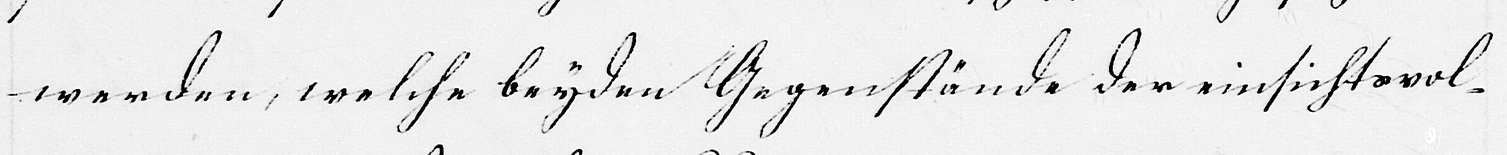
werden, welche beyden Gegenstände der einsichtsvol¬
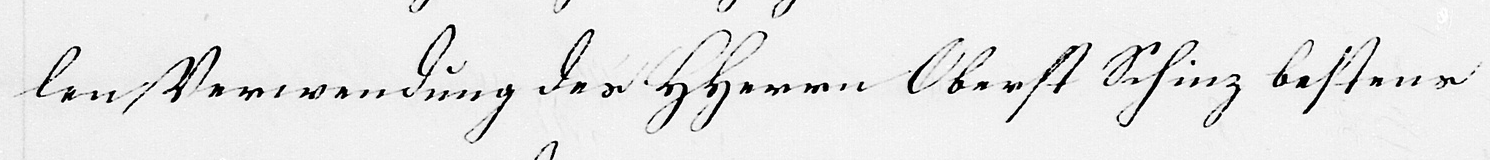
len Verwendung des HHerrn Oberst Schinz bestens
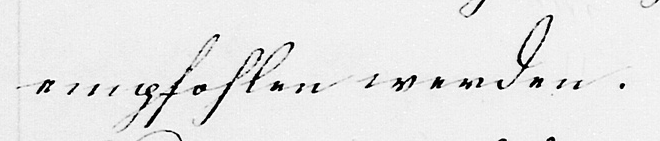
empfohlen werden.
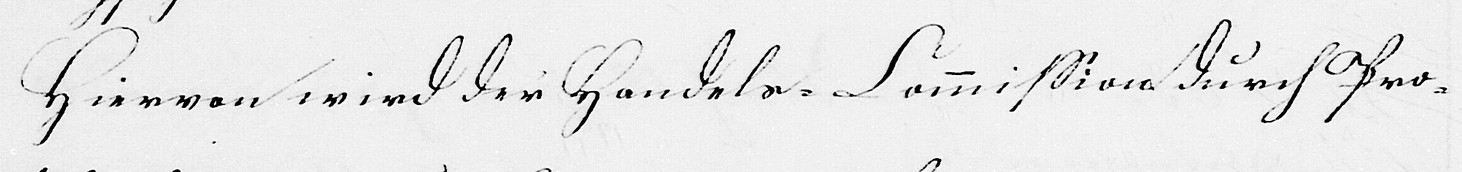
Hiervon wird der Handels-Commißion durch Pro¬
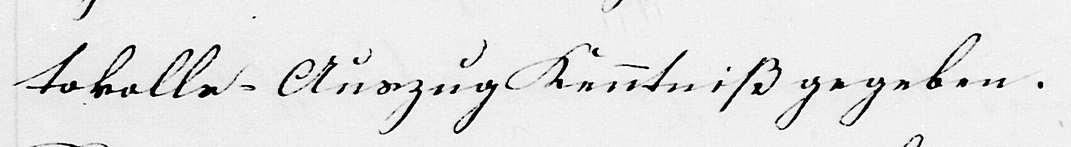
tokolls-Auszug Kenntniß gegeben.
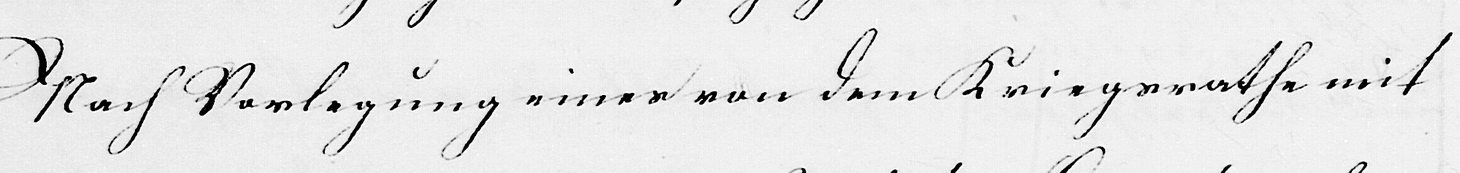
Nach Vorlegung eines von dem Kriegsrathe mit
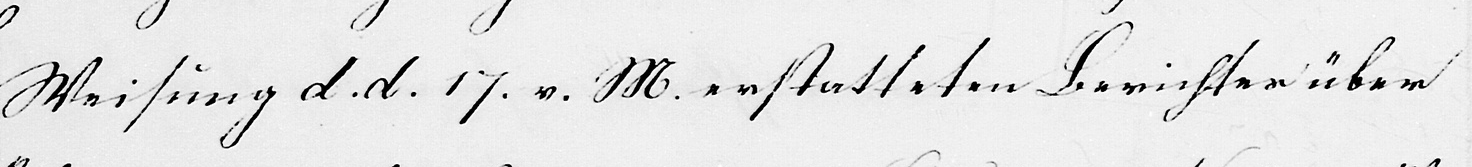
Weisung d. d. 17. v. M. erstatteten Berichtes über
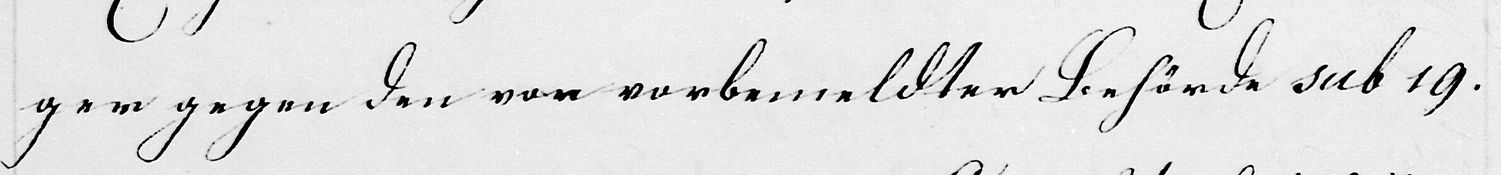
rger gegen den von vorbemeldter Behörde sub 19.
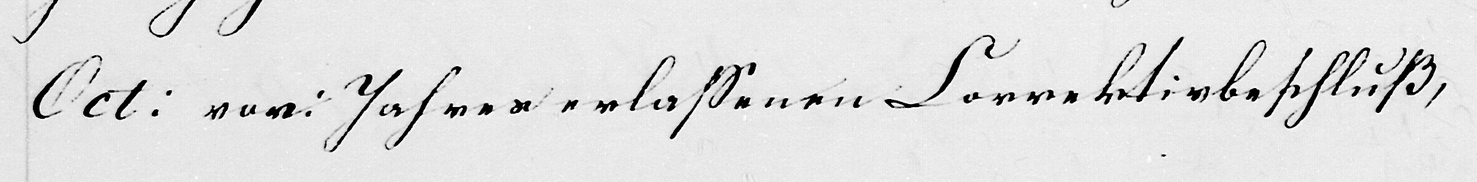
Oct: vor: Jahres erlaßenen Correktivbeschluß,
